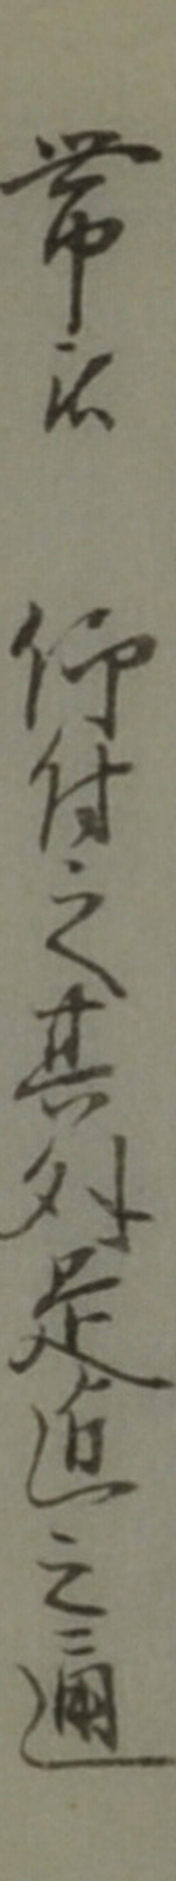帯被仰付之其外是迄之通
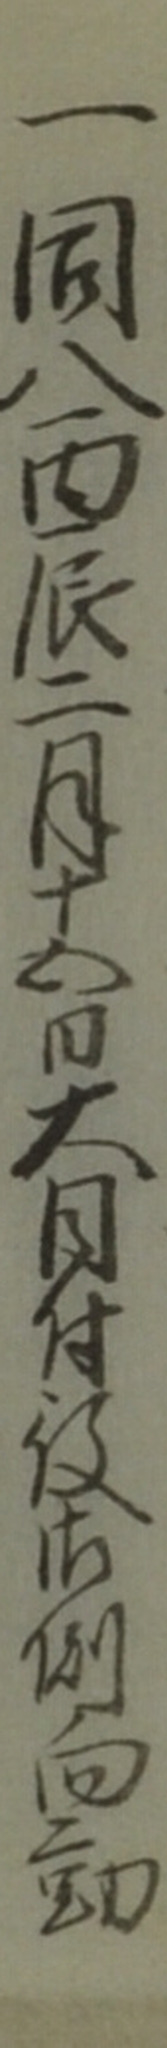一同八丙辰二月十五日大目付役御側向勤
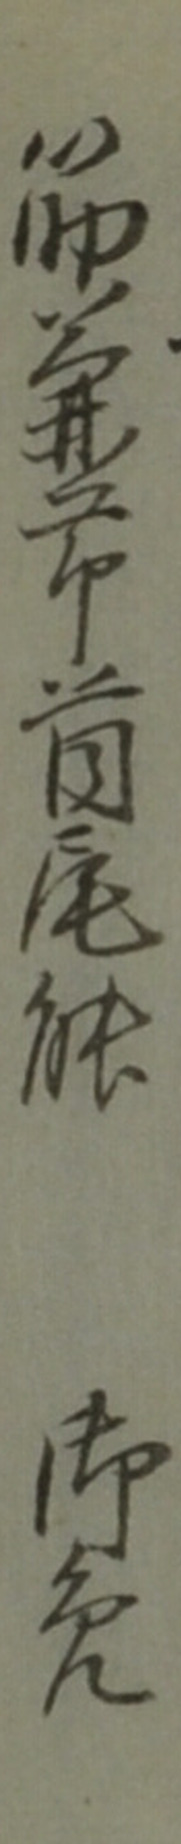筋兼帯首尾能御免
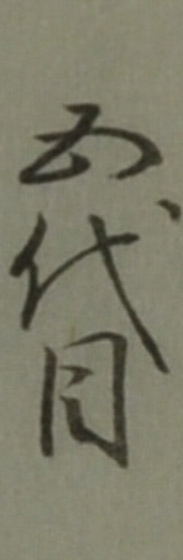五代目
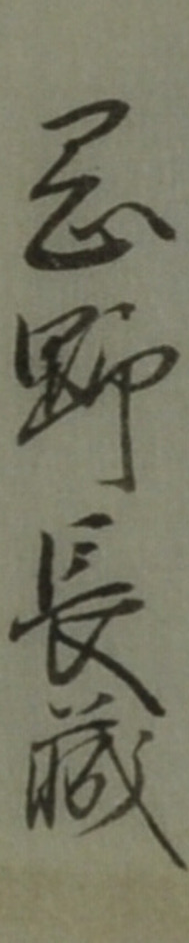岡野長蔵
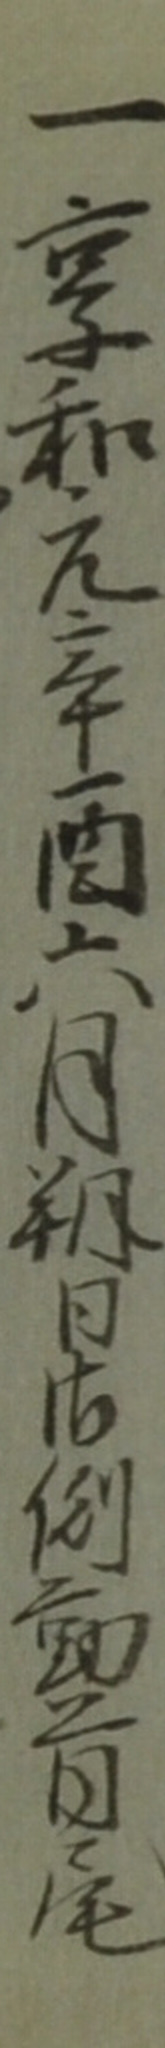一享和元辛酉六月朔日御側勤首尾
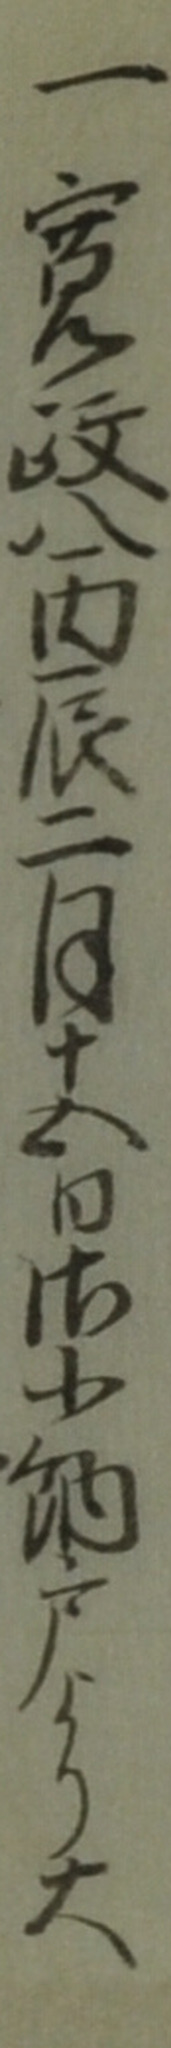一寛政八丙辰二月十五日御小納戸より大
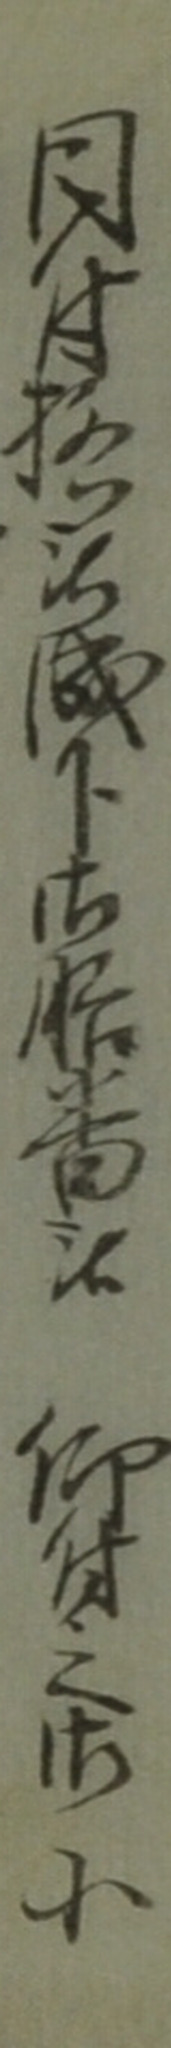目付格被成下御膳番被仰付之尾小
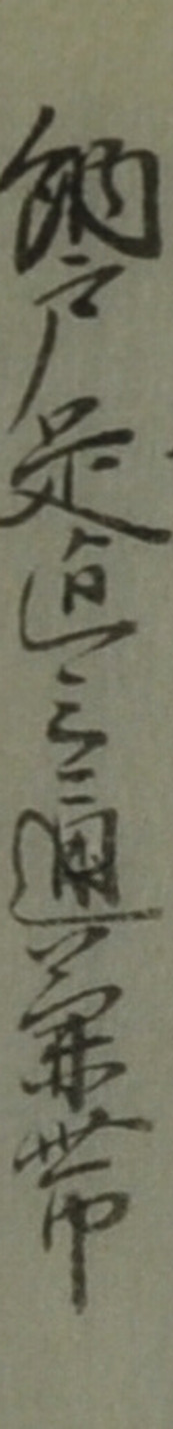納戸是迄之通兼帯
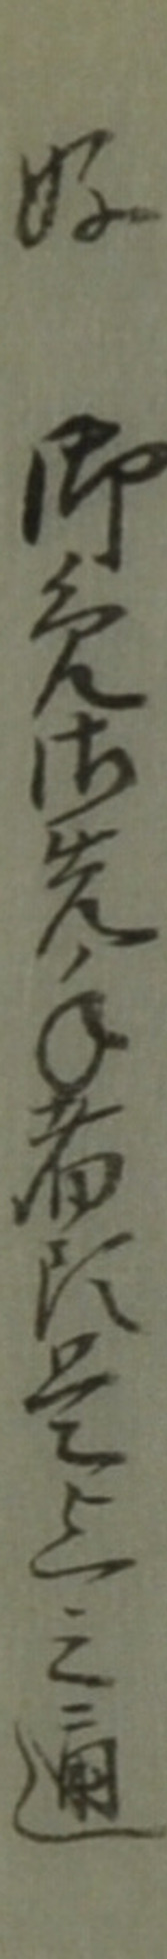好御免御先手者頭是迄之通
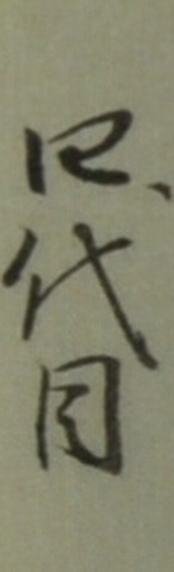四代目

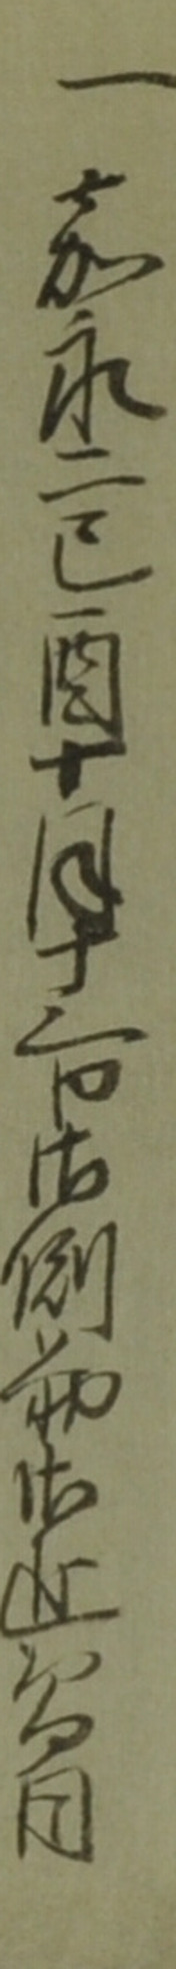一嘉永二己酉十月十三日御側勤御近習目
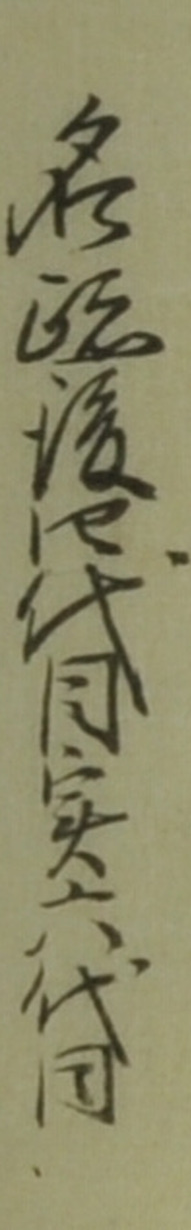名跡後四代目実六代目
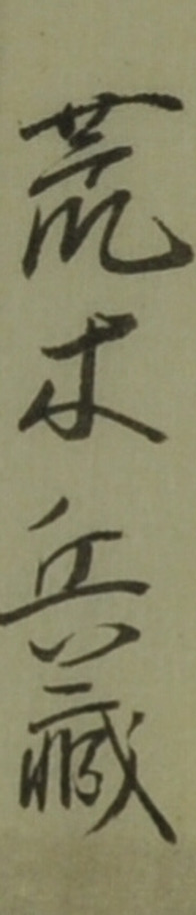荒木兵蔵
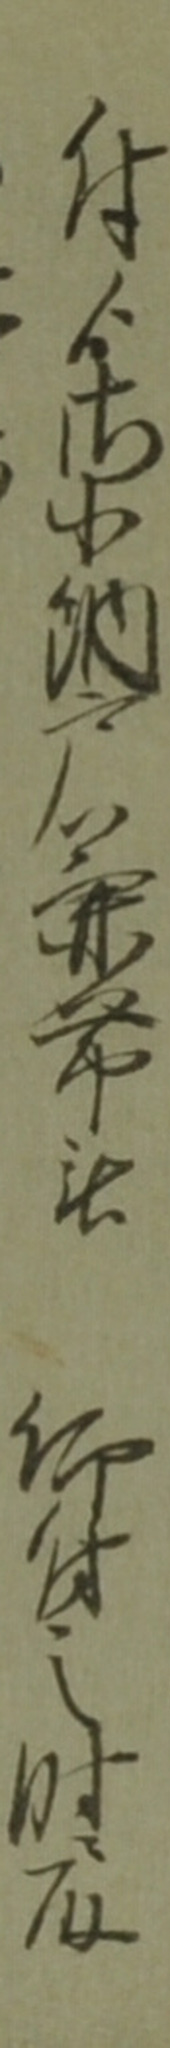付ゟ御小納戸兼帯被仰付之時取
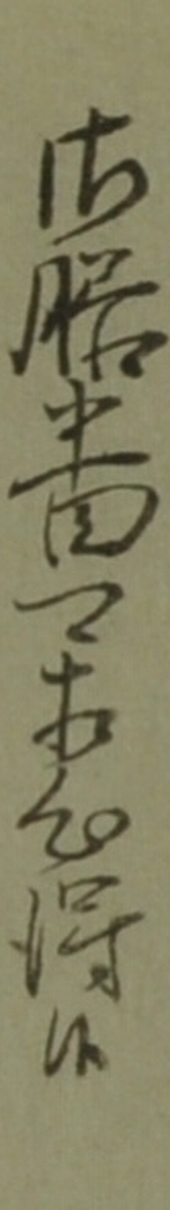御膳番可相心得候
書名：諸御役代々録（四）
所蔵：伊那市立高遠町図書館・合同会社AMANE
